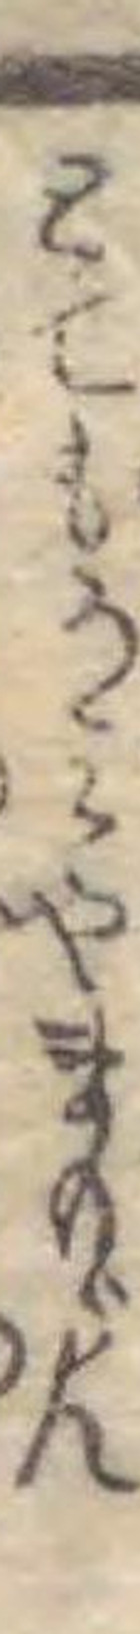とてもかみやまもらん
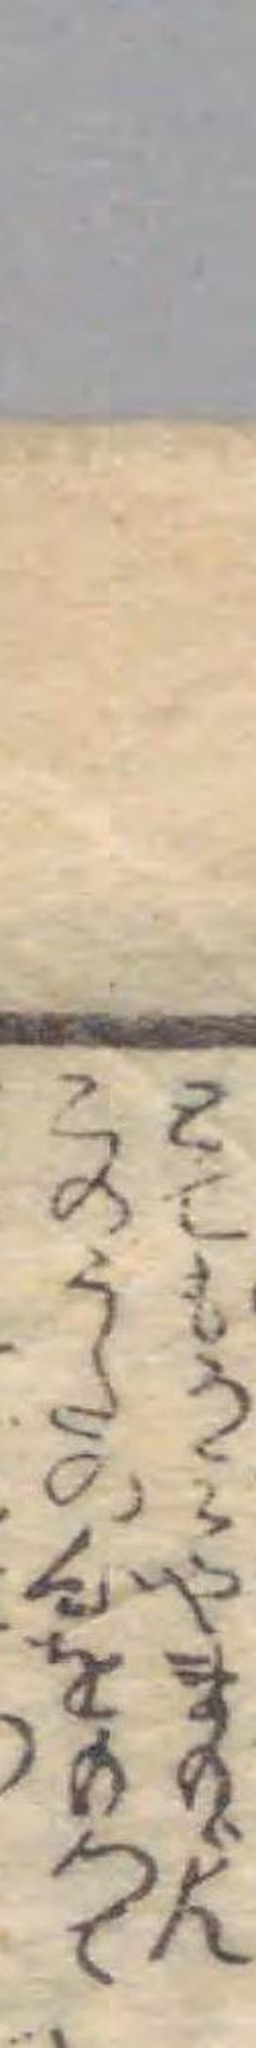このうたの心をもつて
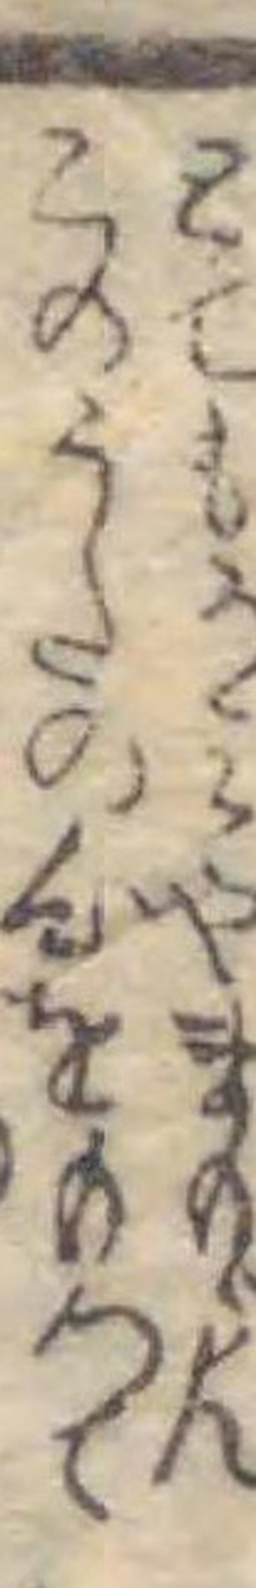このうたの心をもつて
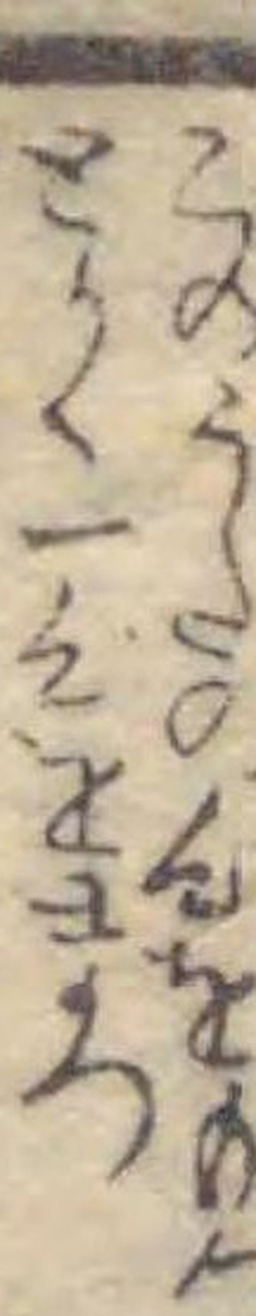とかく一升をまつ
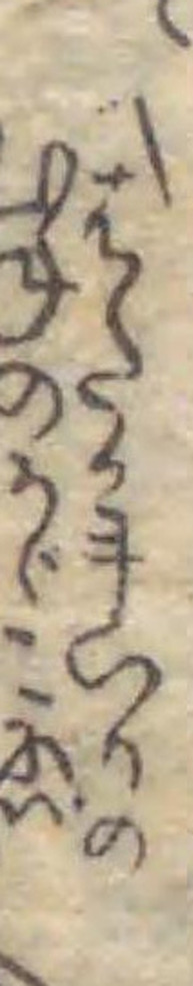むねのかゞみは
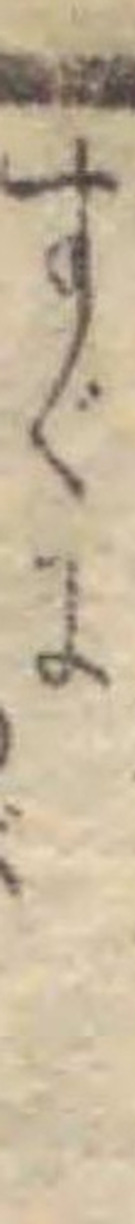すぐに
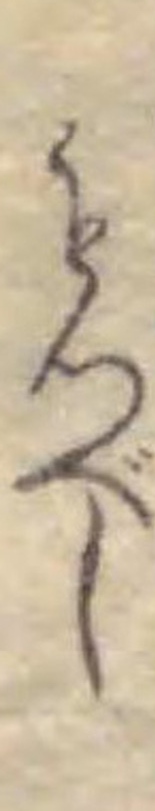もつべし
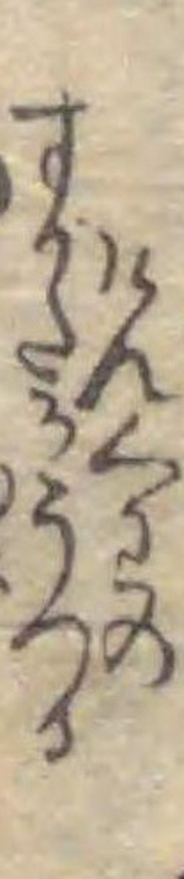すがたかうつる
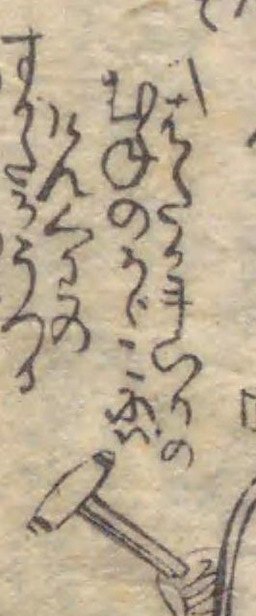けんくわの
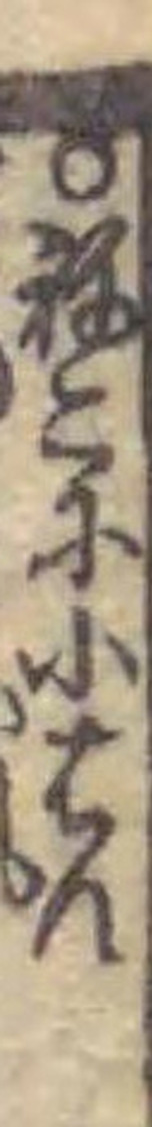○ねこに小はん
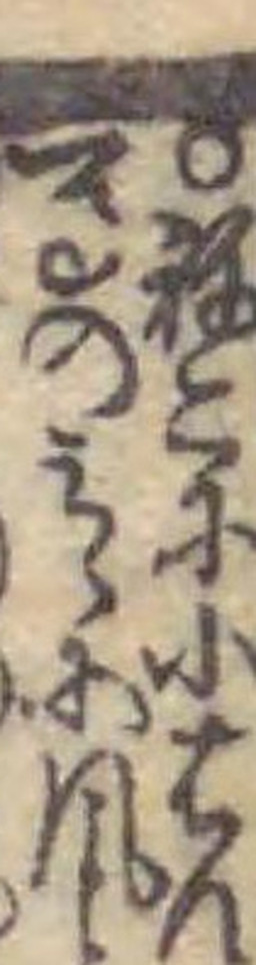馬のみゝに風と
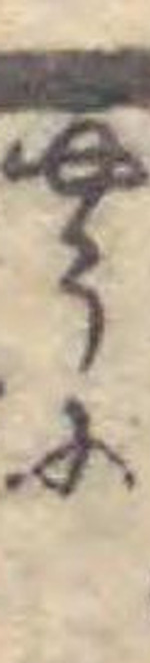やうに
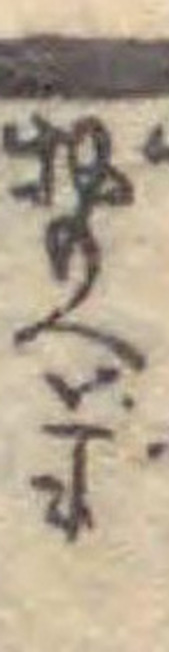おもへども
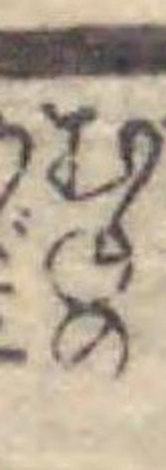むねの
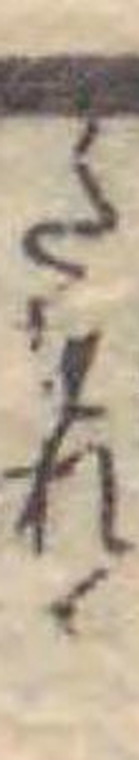たをれて
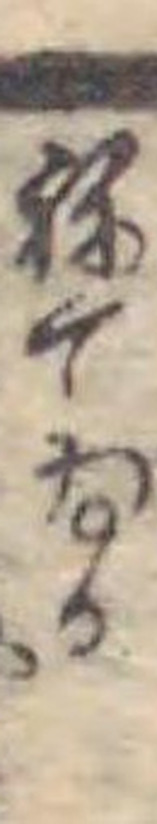ねてゐる
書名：人心鏡写絵 : 3巻
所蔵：国立国会図書館 National Diet Library, JAPAN
